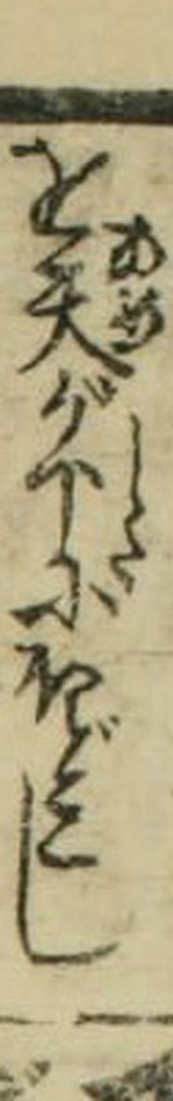を天が下にほどこし
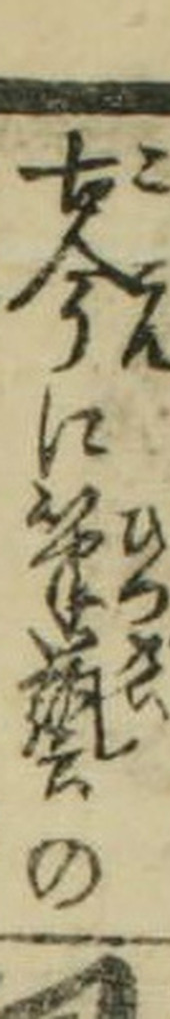古今に筆藝の
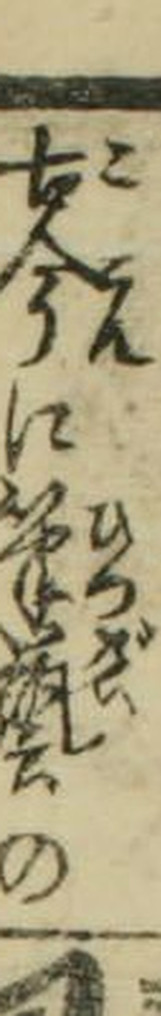古今に筆藝の
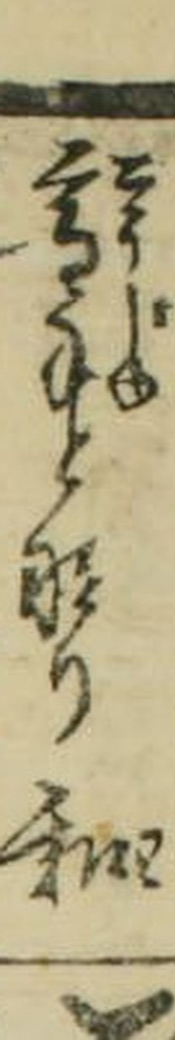高手となり和
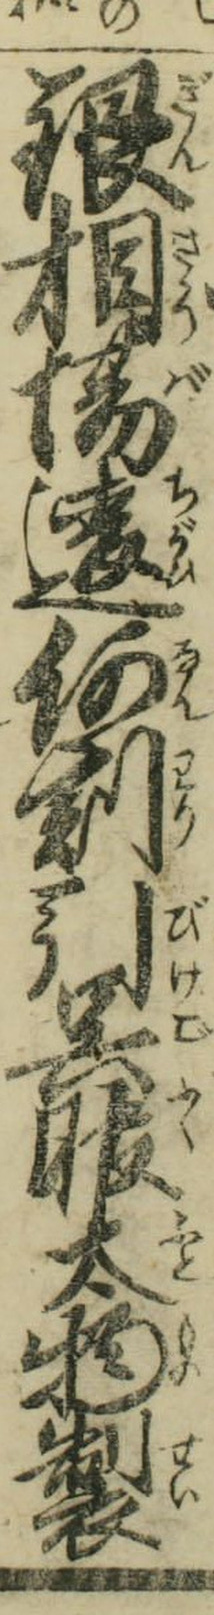銀相場違何割引呉服太物製
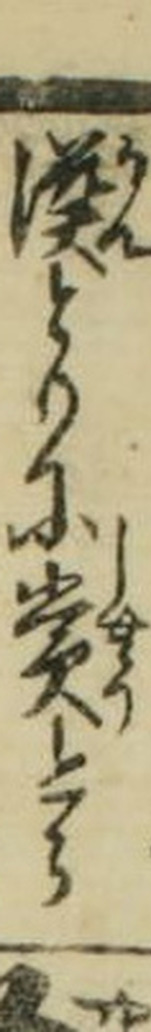漢ともに賞とら
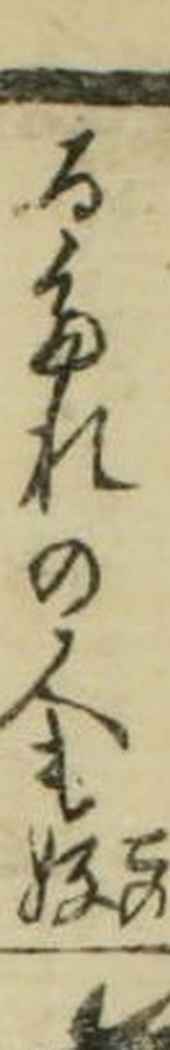るたれの人も好
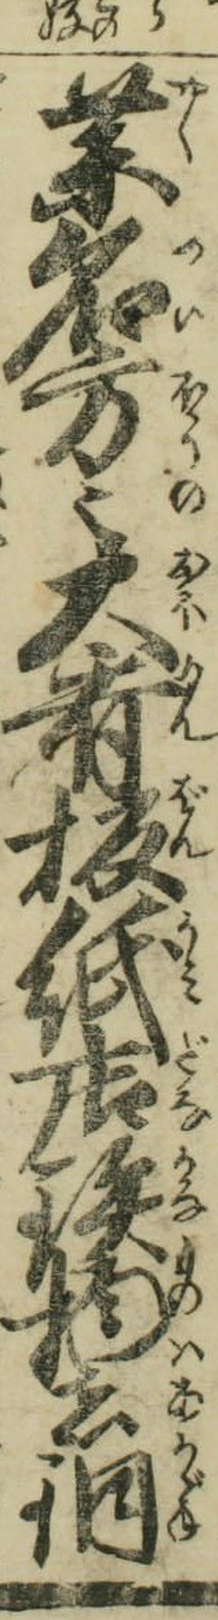薬名方之大看板紙店鉄物者銅
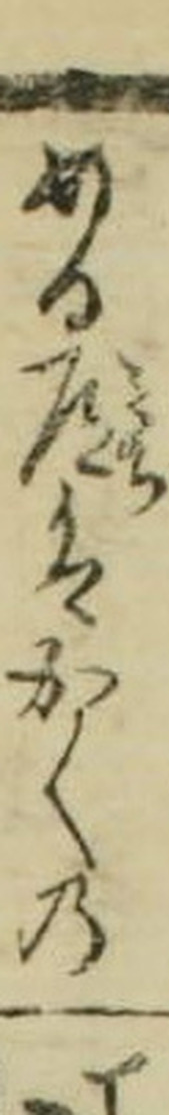める道はかくの
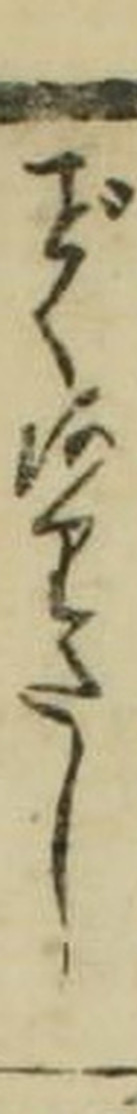ごとくありたし
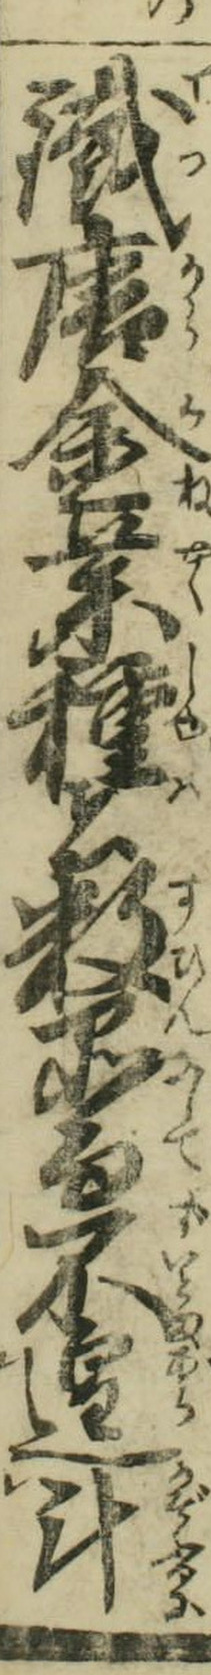鐡唐金薬種者数品而不遑計
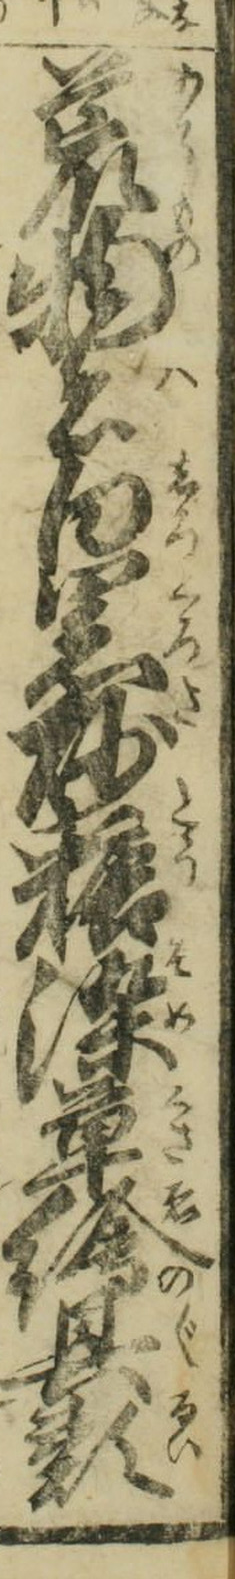荒物者白黒砂糖染草繪具類
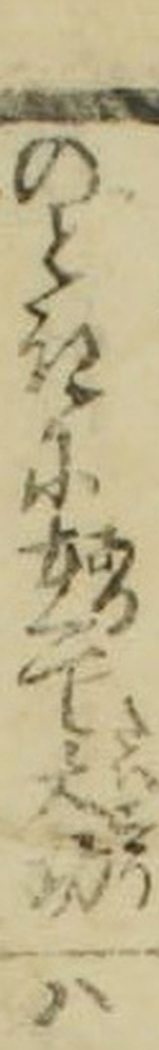のときに在て大功
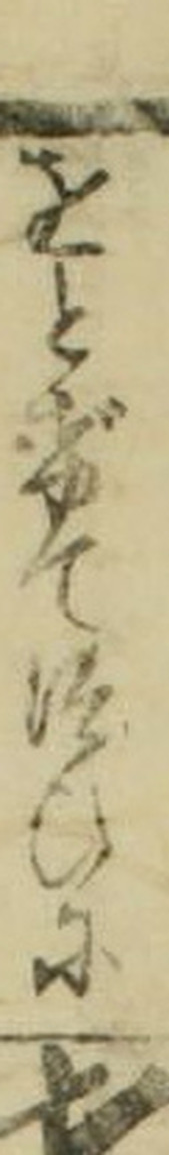をとげてつひに
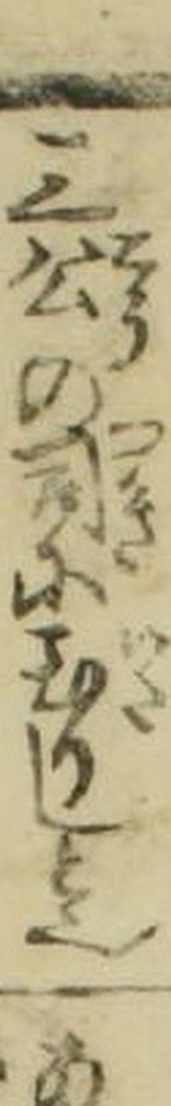三公の司に至りしと也
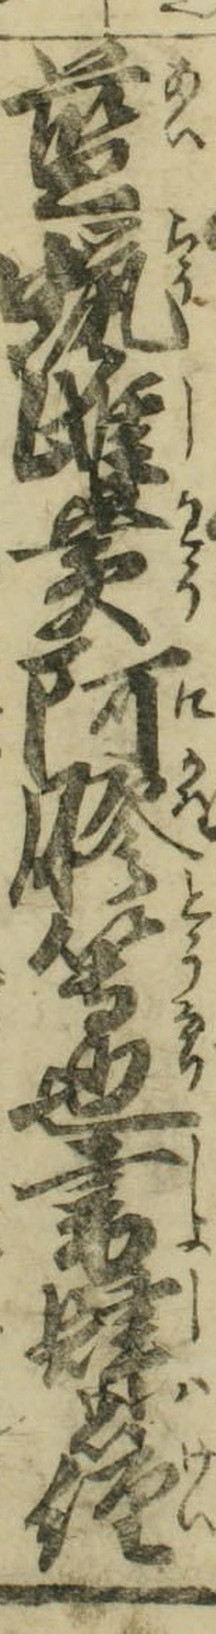藍蠟雌黄阿膠等也書肆者經
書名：増補職人往来
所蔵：東京学芸大学教育コンテンツアーカイブ
